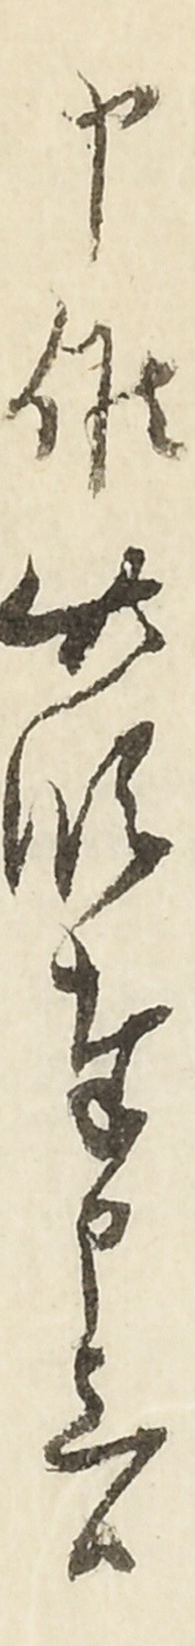申候此段奉申上候
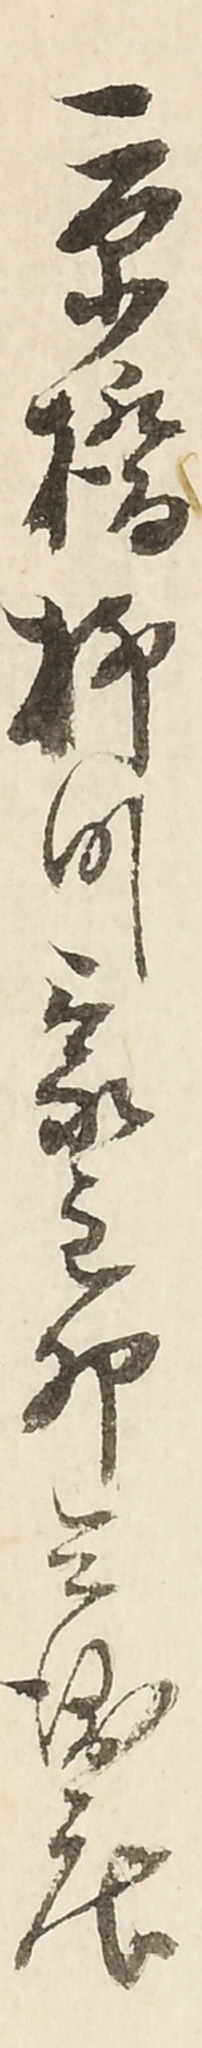京橋柳川家主卯兵衛店
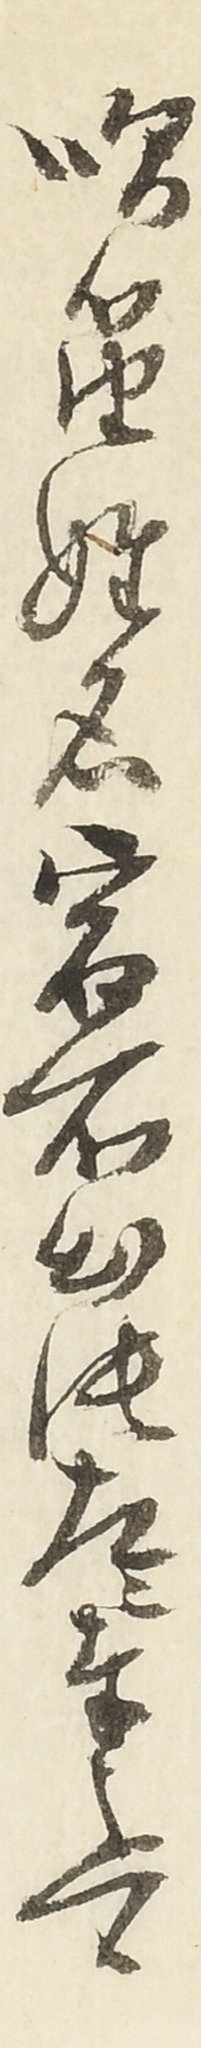吹笛姓名宿所出張左に奉申上候
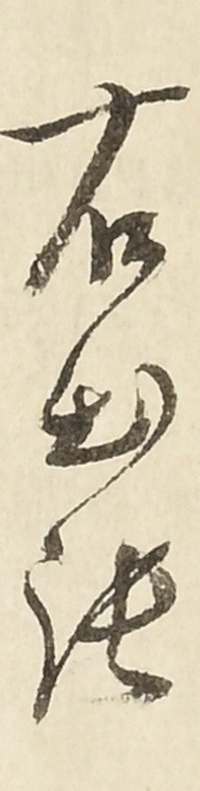右出張
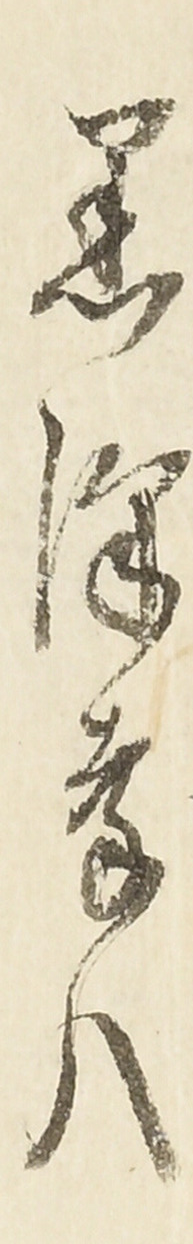黒沢幸八
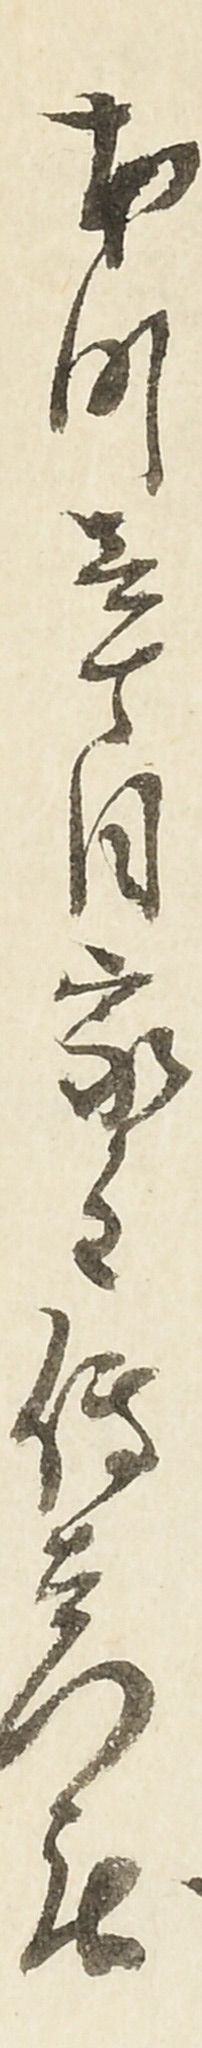本町壱丁目家主伝右衛門店
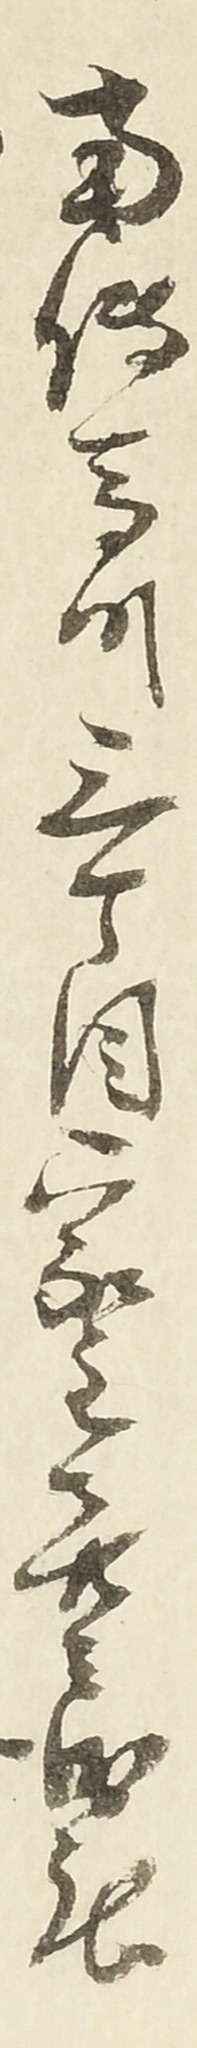南伝馬町三丁目家主喜兵衛店
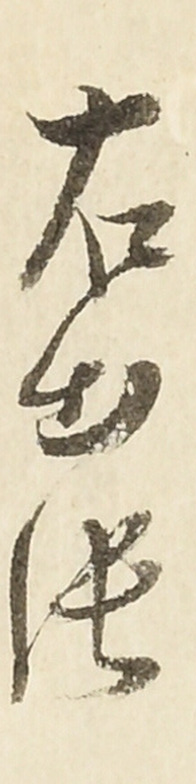右出張
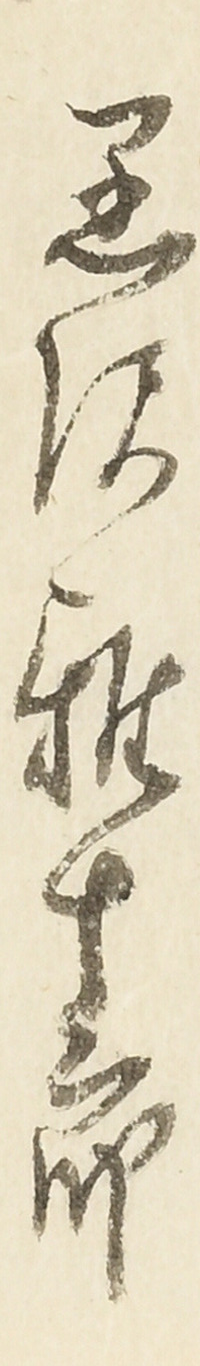黒沢雅十郎
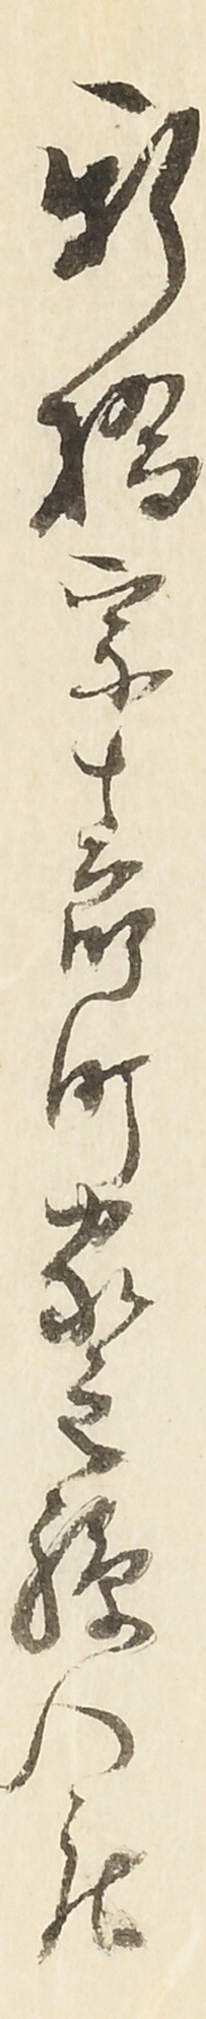新橋宗十郎町家主孫八店
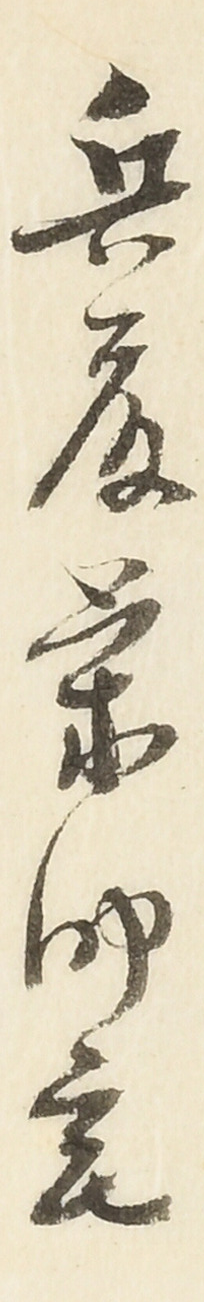兵藤栄助宅
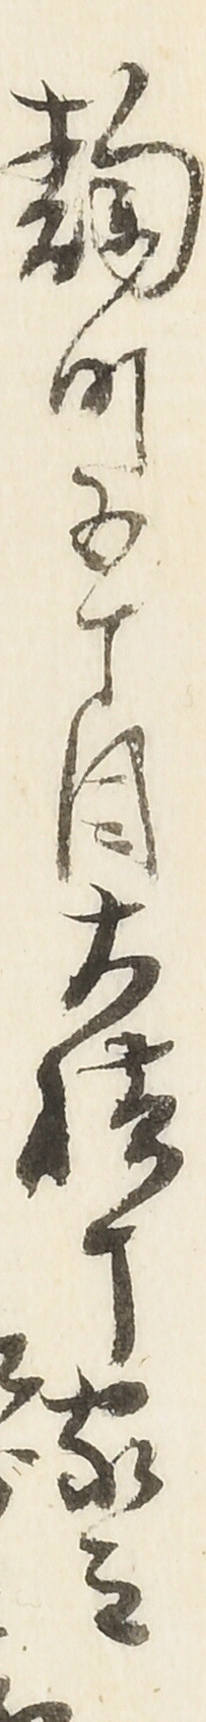麹町五丁目大横丁家主
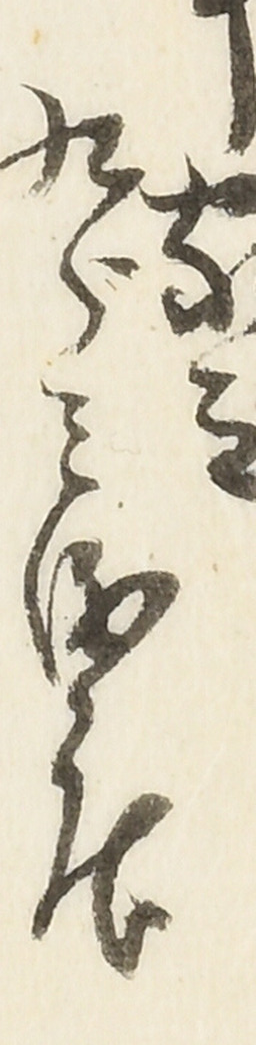九郎兵衛店
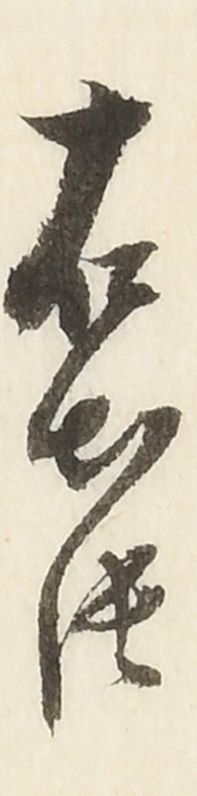右出張
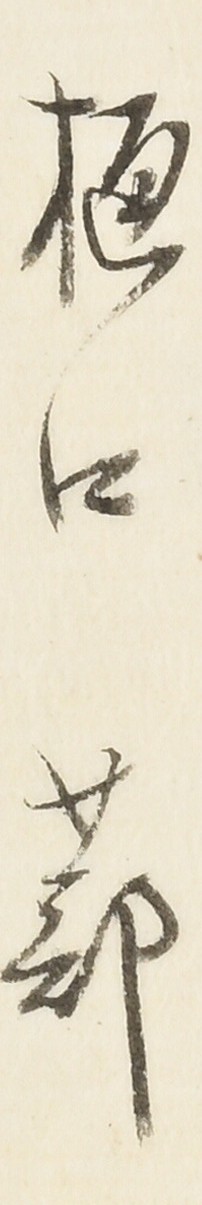樋口蔀
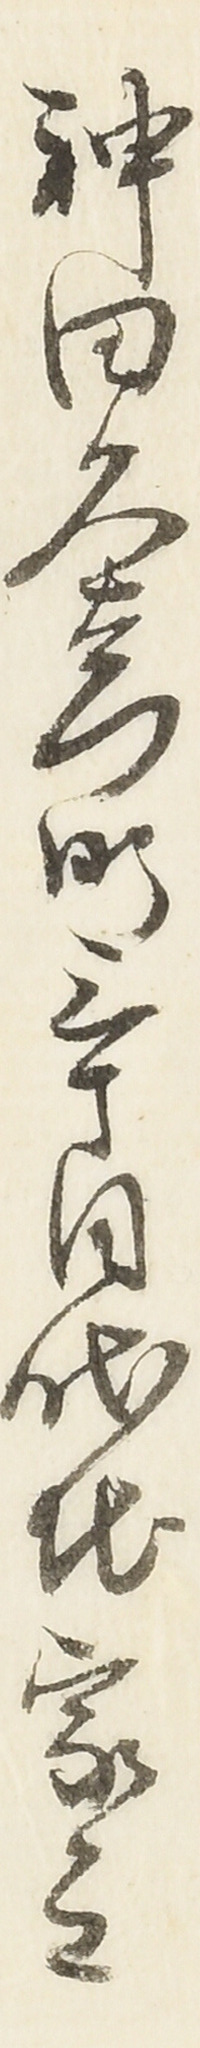神田久右衛門町三丁目代地家主
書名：秘書
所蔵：伊那市立高遠町図書館・合同会社AMANE
